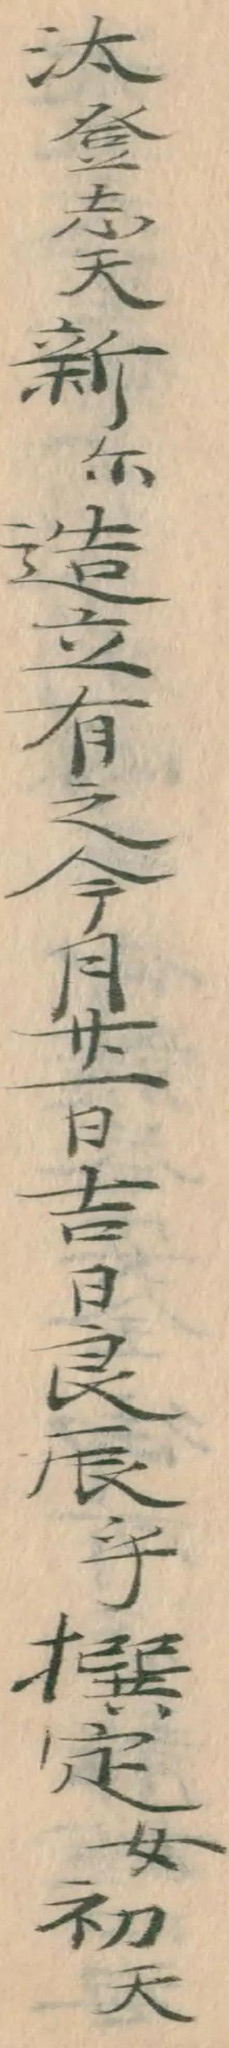汰登志天新尒造立有之今月廿一日吉日良辰乎撰定女初天

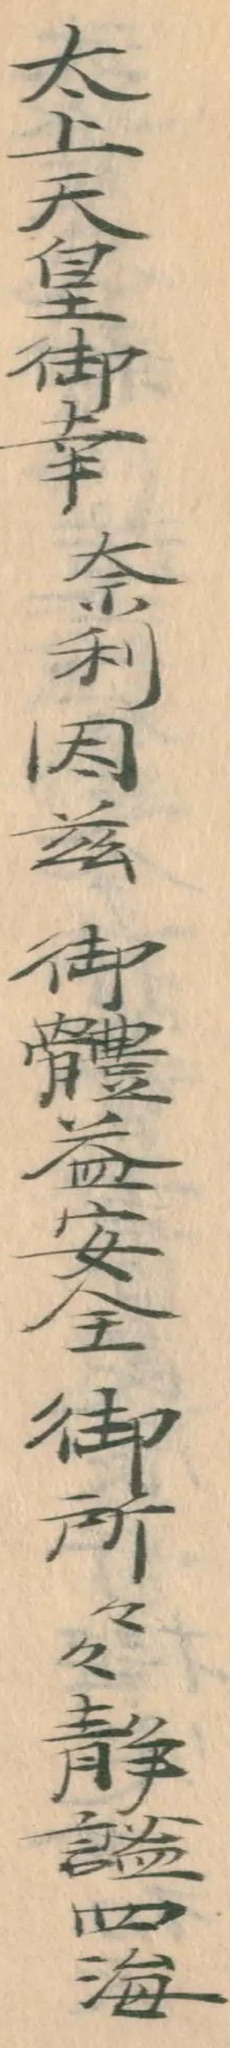太上天皇御奈利因茲御體益安全御所々々静謐四海
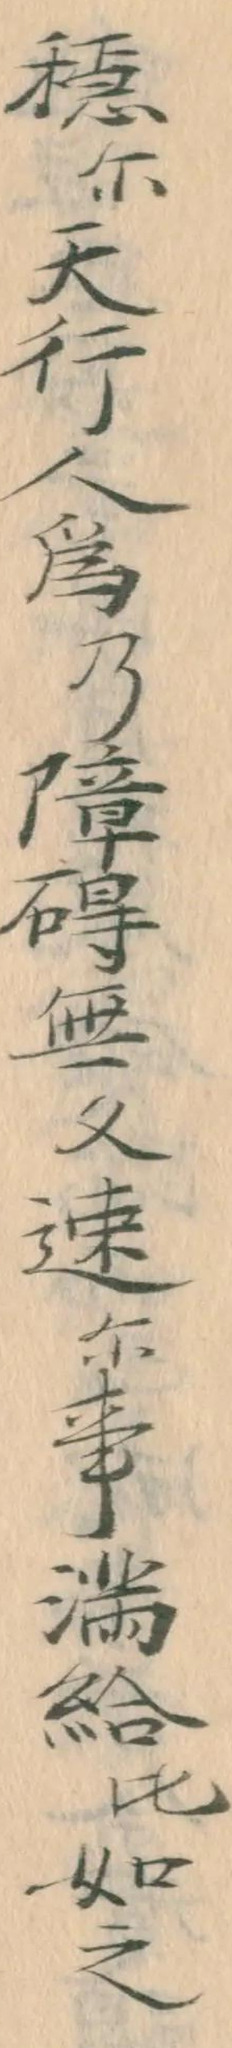穏尓天行人為乃障碍無久速尓事満給比如之
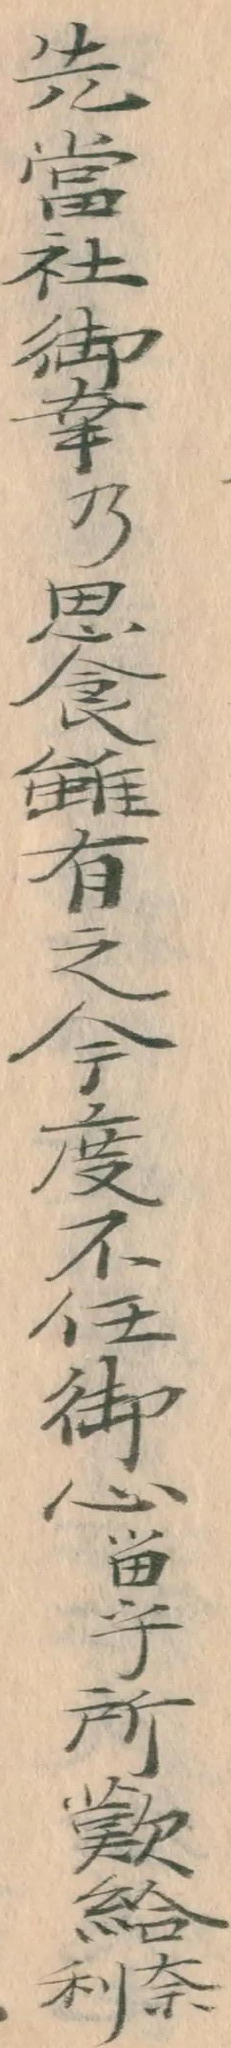先當社御幸乃思食雖有之今度不任御心留乎所歎給奈利
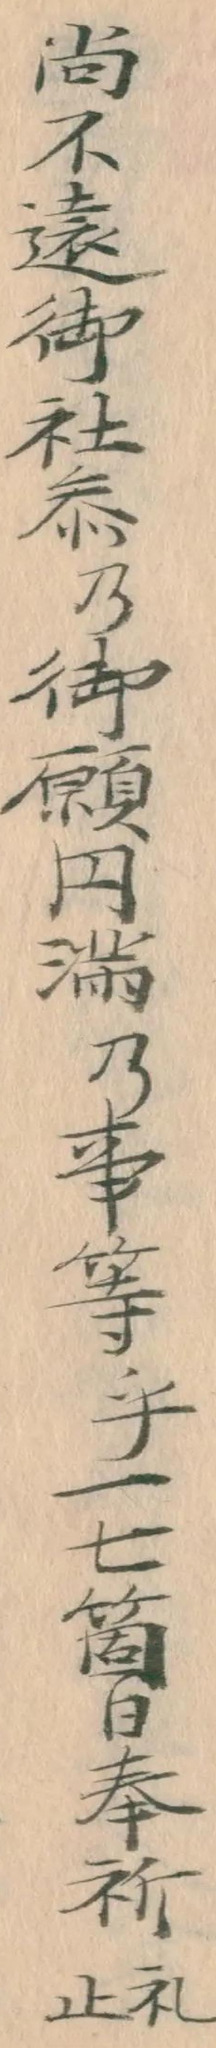尚不遠御社参乃御願円満乃事等乎一七箇日奉祈礼止
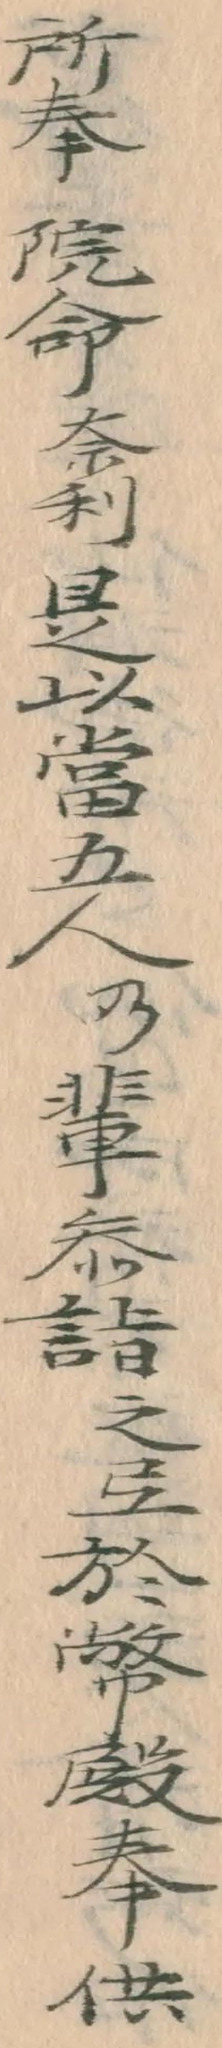所奉院命奈利是以當五人乃輩参詣之弖於幣殿奉供
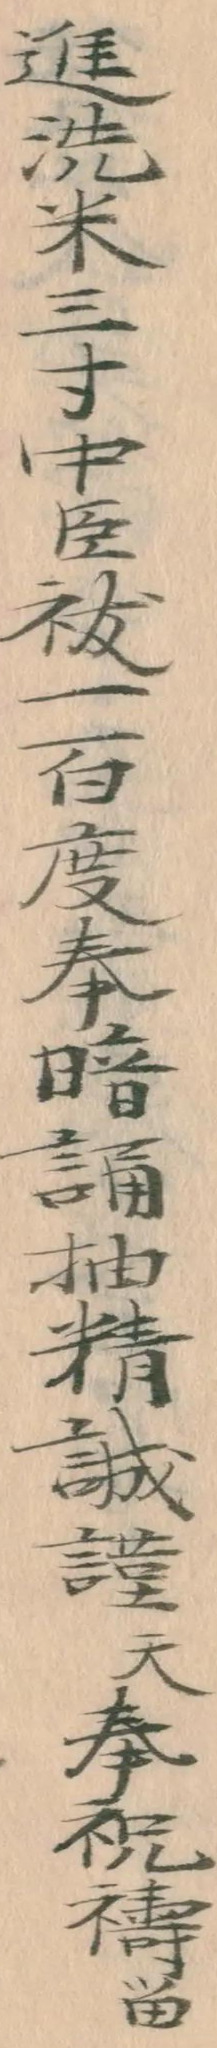進洗米三寸中臣祓一百度奉暗誦抽精誠謹天奉祝祷留
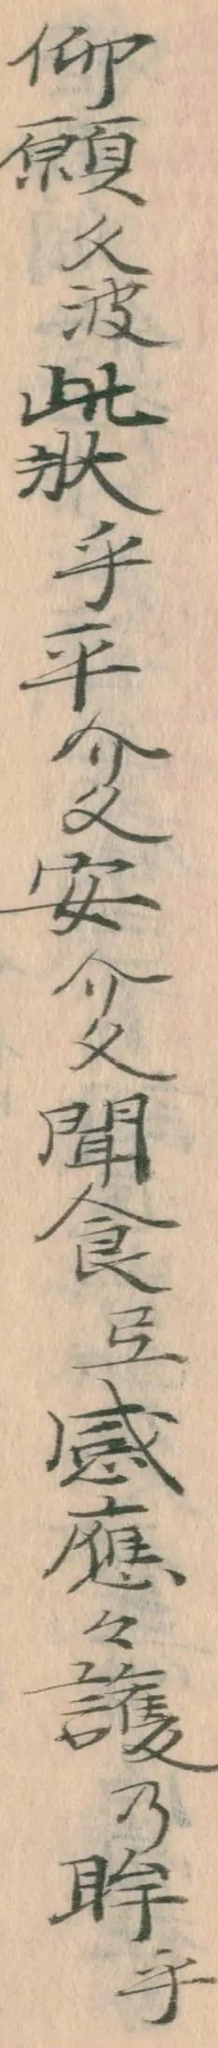仰願久波此状乎平介久安介久聞食弖感應々護乃眸乎
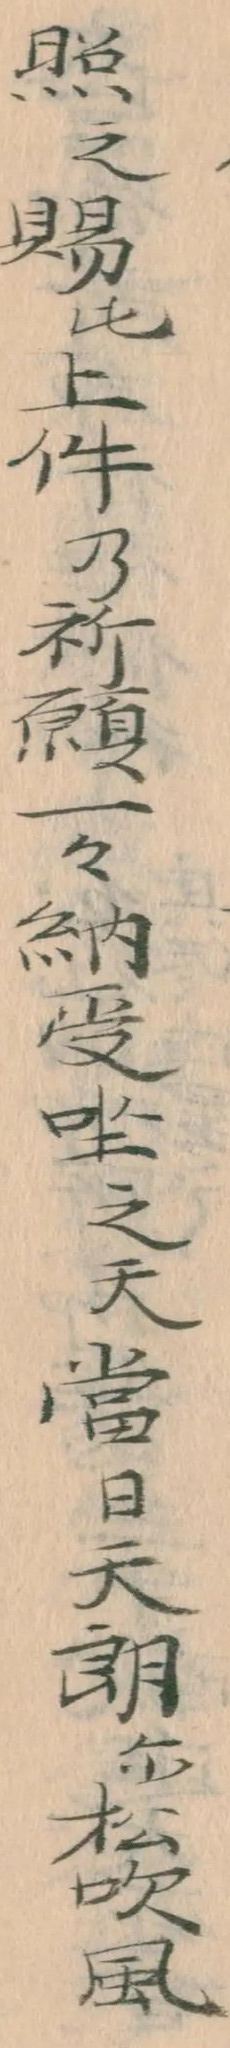照之賜比上件乃祈願一々納受坐之天當日天朗尓松吹風
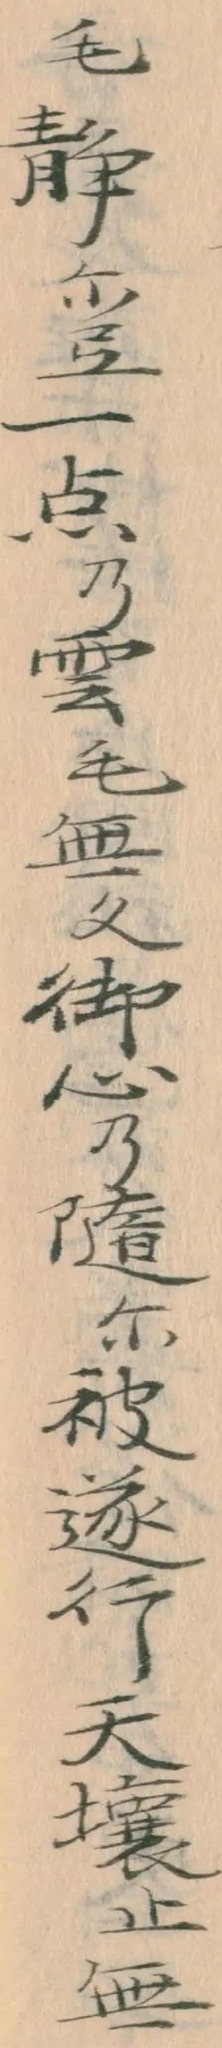毛静尓弖一点乃雲毛無久御心乃随尓被遂行天壌止無
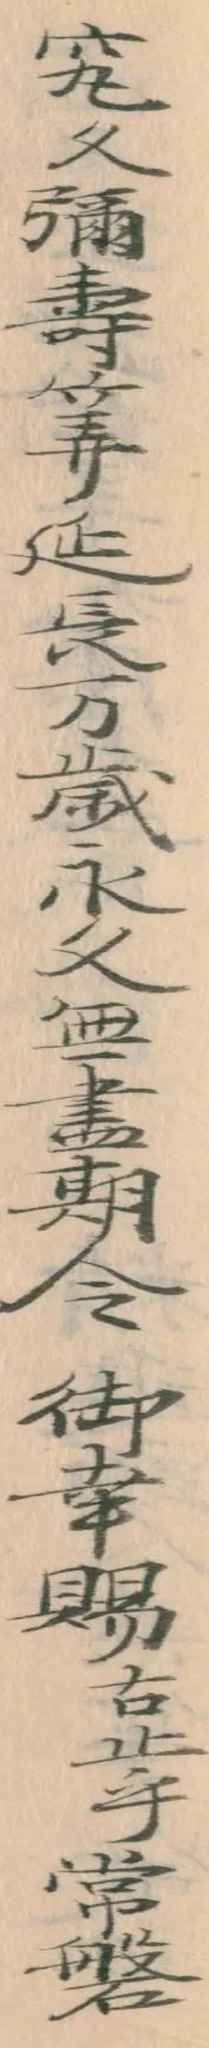究久彌壽筭延長万歳永久盡す期令御幸賜古止乎常盤
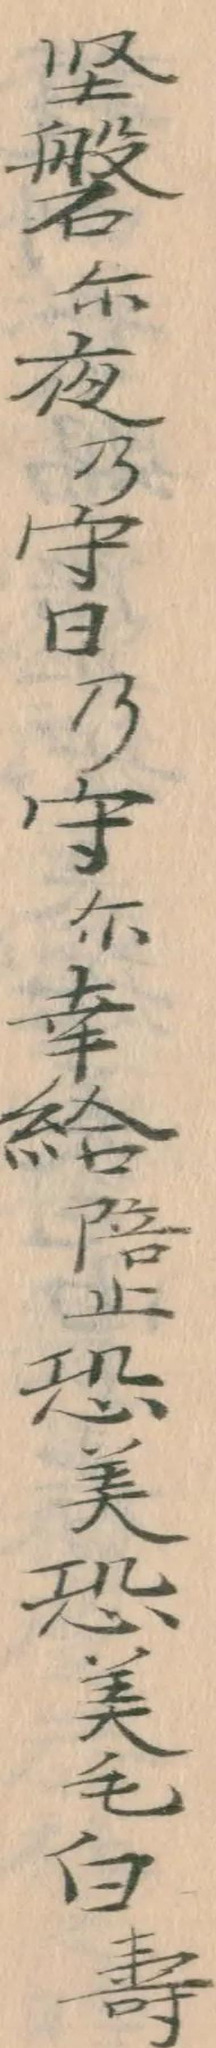堅盤尓夜乃守日乃守尓幸給陪止恐美恐美毛白壽
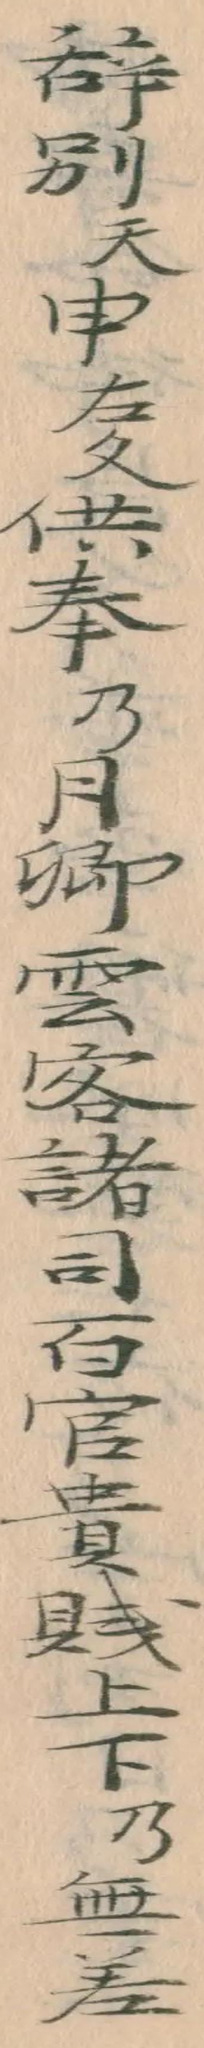辞別天申左久供奉乃月卿雲客諸司百官貴賤上下乃無差
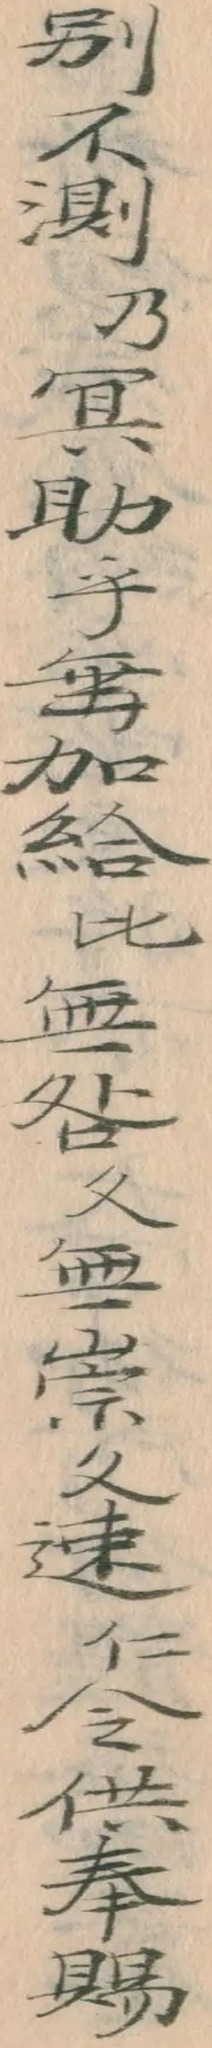別不測乃冥助乎垂加給比無咎久無崇久速仁令供奉賜
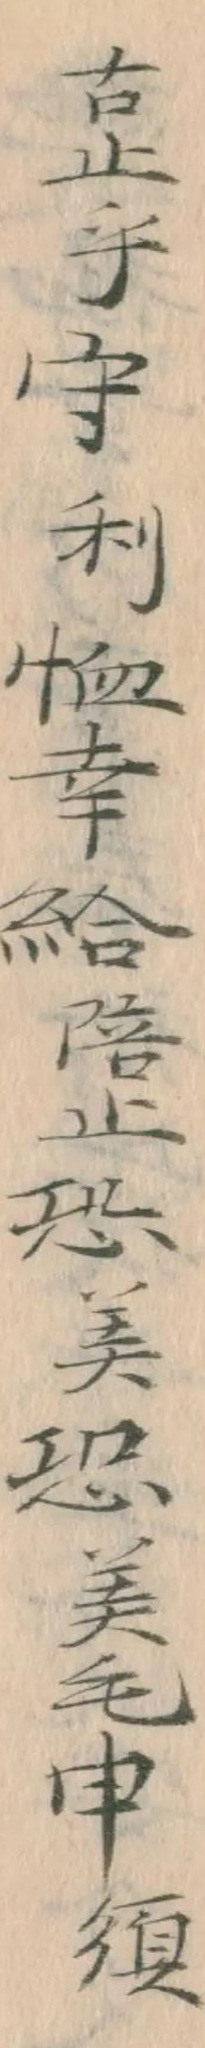古止乎守恤幸給陪止恐美恐美毛申須
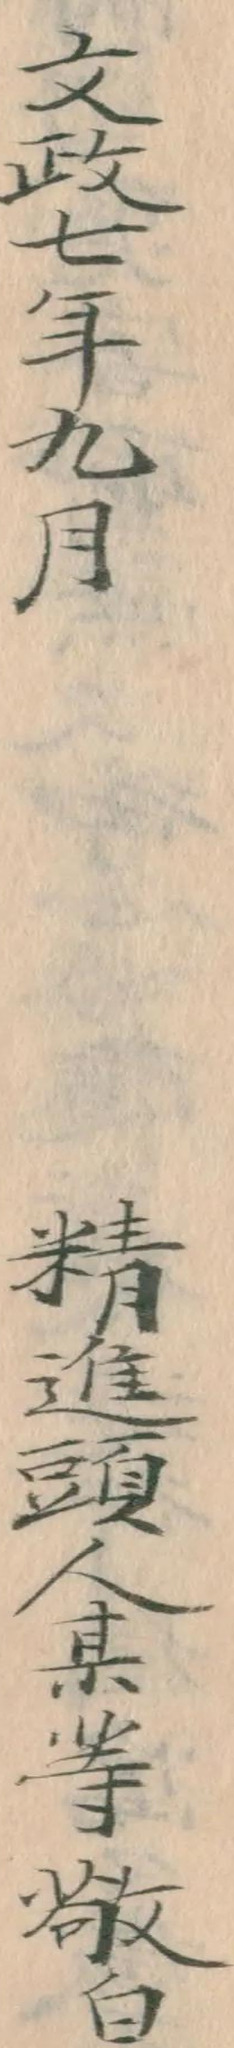文政七年九月精進頭人某等敬白
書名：賀茂社記録. 第74冊
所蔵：国立国会図書館 National Diet Library, JAPAN
